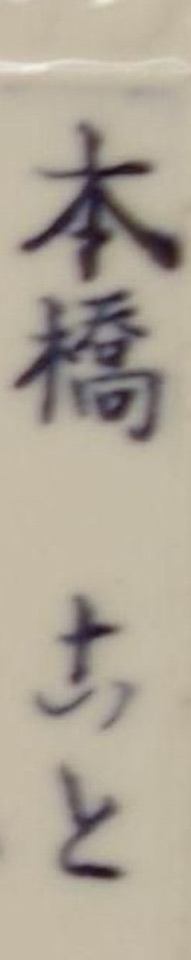本橋こと
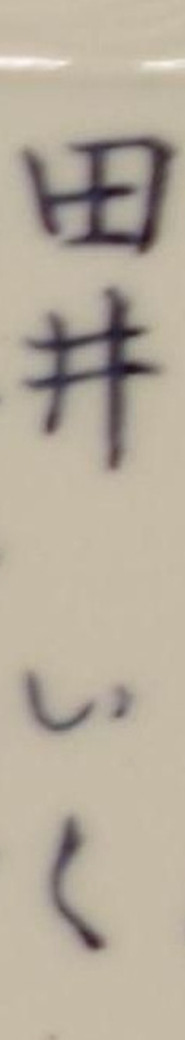田井いく
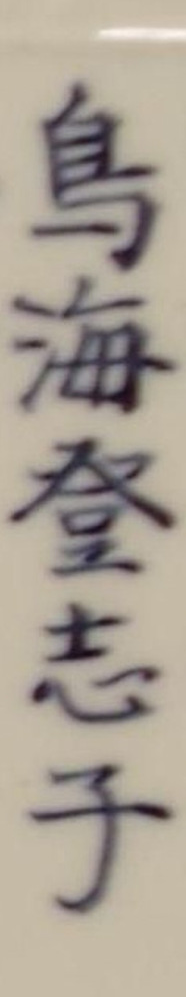鳥海登志子
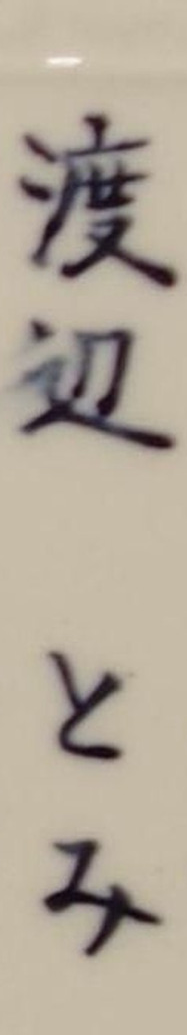渡辺とみ
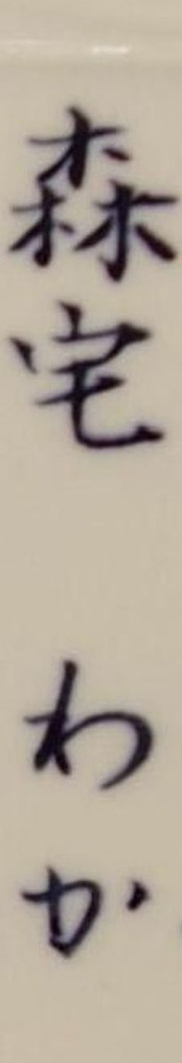森宅わか
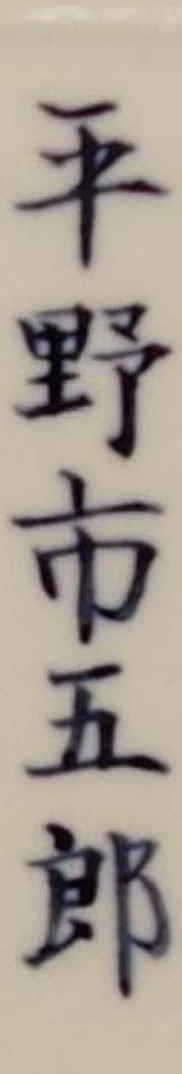平野市五郎
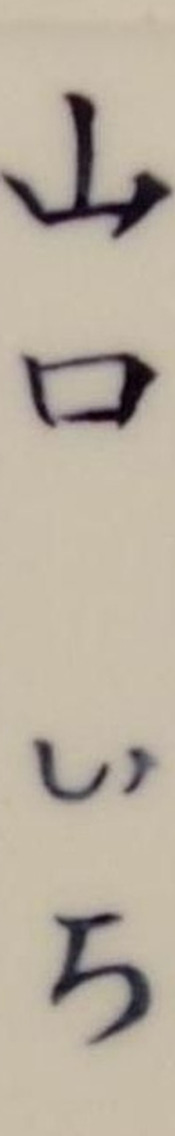山口いち
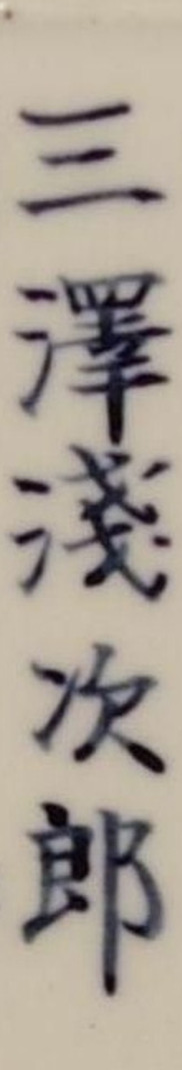三澤浅次郎
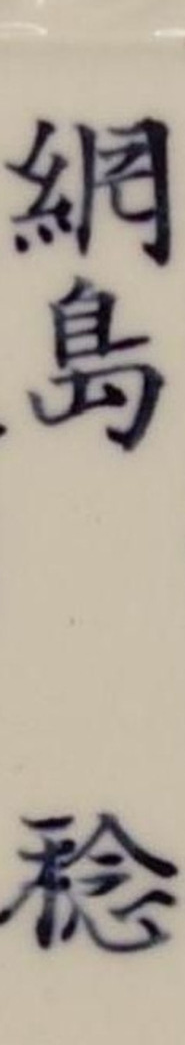綱島稔
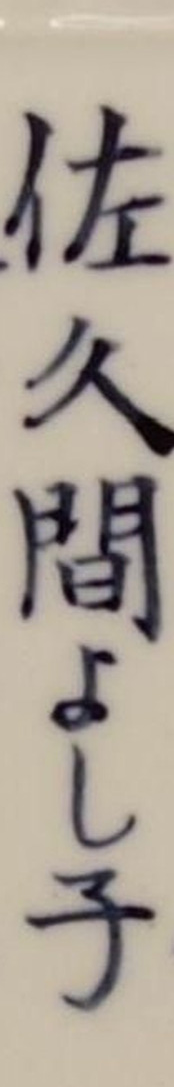佐久間よし子
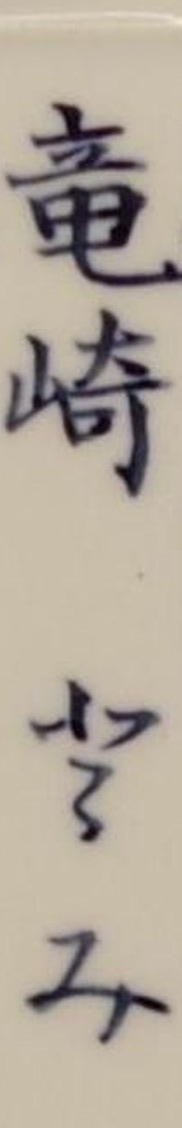竜崎とみ
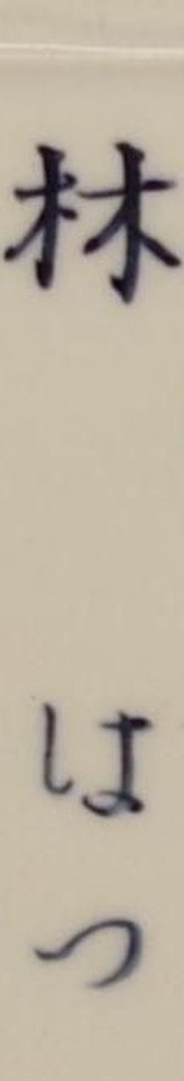林はつ
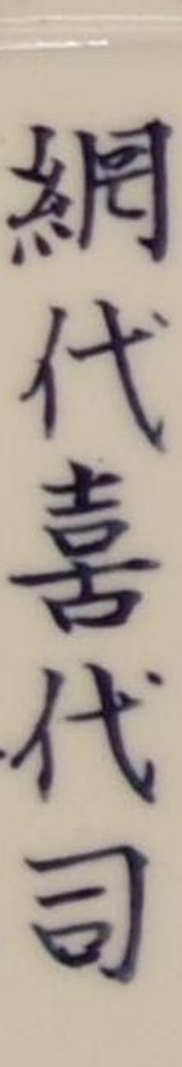網代喜代司

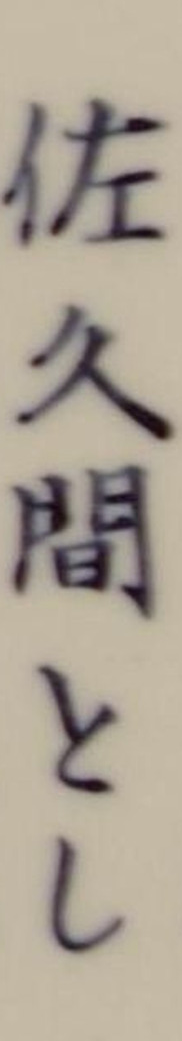佐久間とし
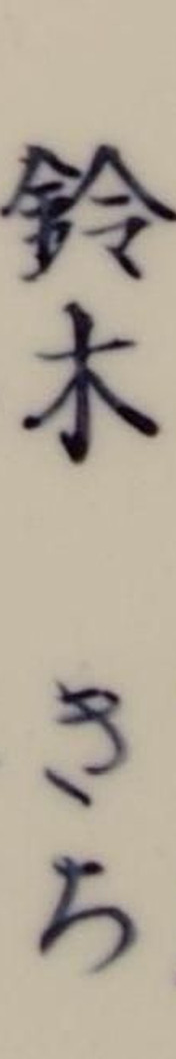鈴木きち
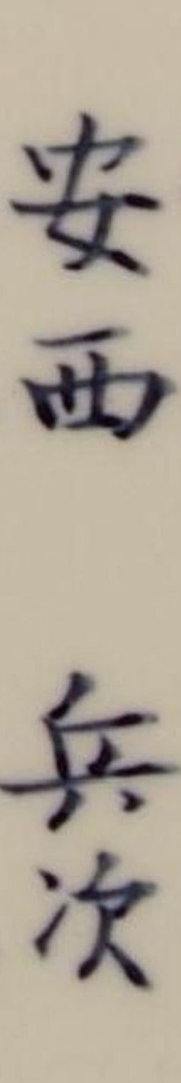安西兵次
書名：M~S
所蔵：高野山金剛峯寺
